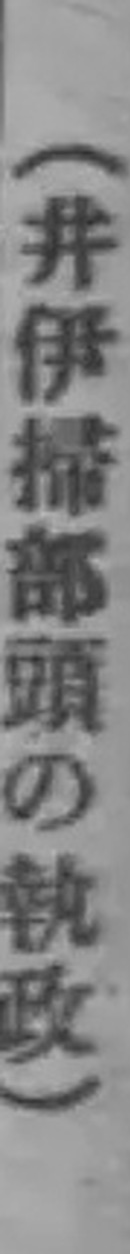◉井伊掃部頭の執政
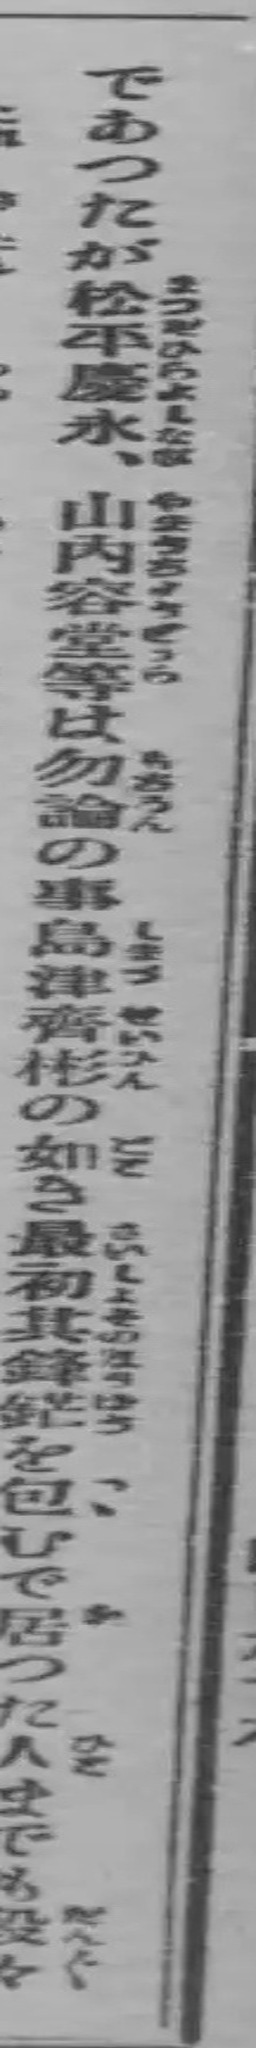であつたが松平慶永、山内容堂等は勿論の事島津齋彬の如き最初其鋒鋩を包むで居つた人までも段々
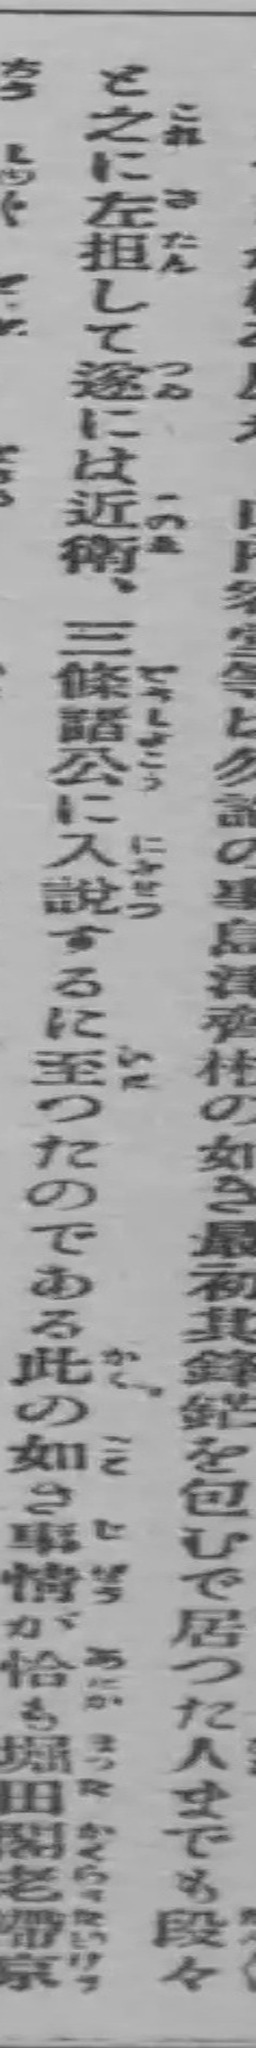と之に左担して遂には近衛、三條諸公に入説するに至つたのである此の如き事情が恰も堀田閣老滞京
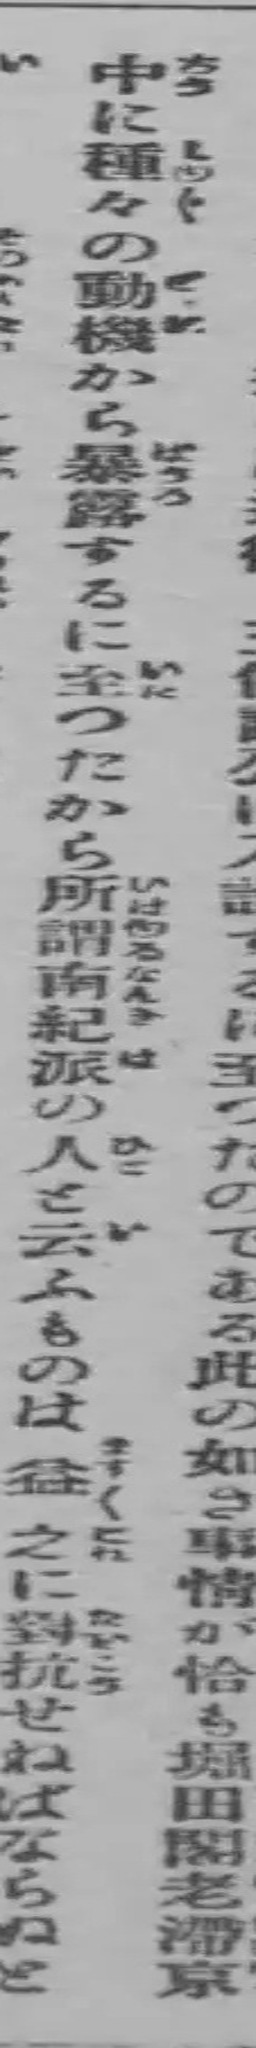中に種々の動機から暴露するに至つたから所謂南紀派の人と云ふものは益之に対抗せねばならぬと
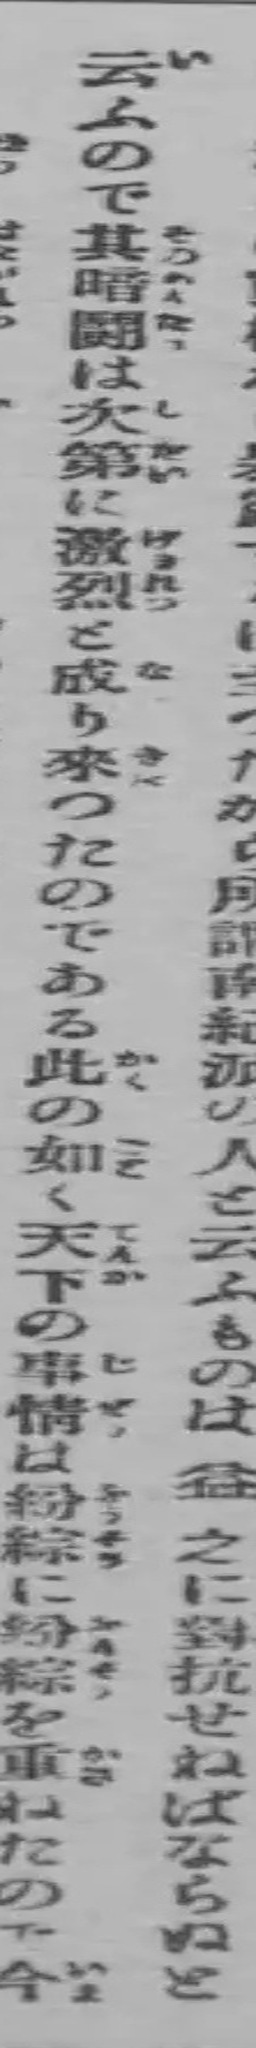云ふので其暗闘は次第に激烈と成り来つたのである此の如く天下の事情は紛綜を重ねたので今
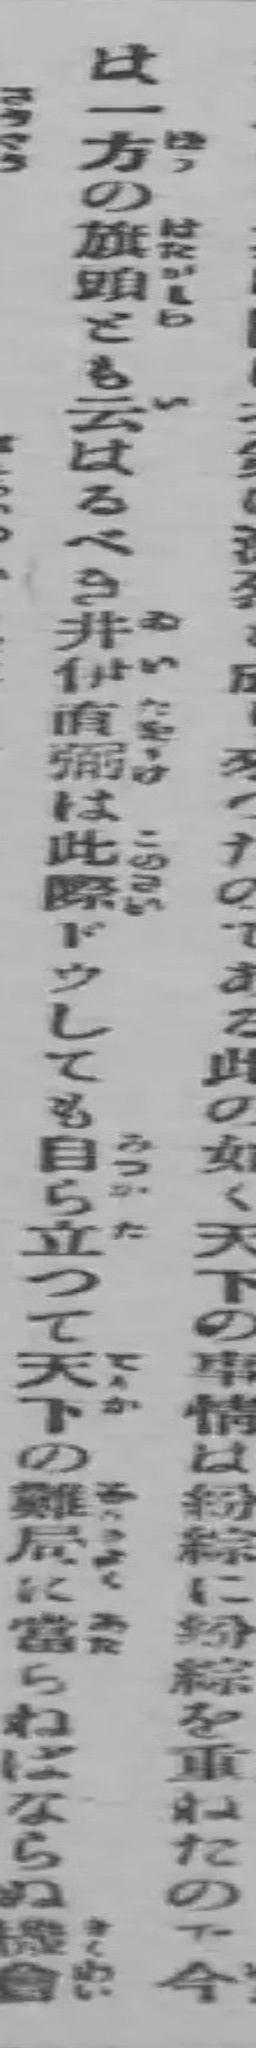は一方の旗頭とも云はるべき井伊直弼は此際ドウしても自ら立つて天下の難局に当らねばならぬ機会
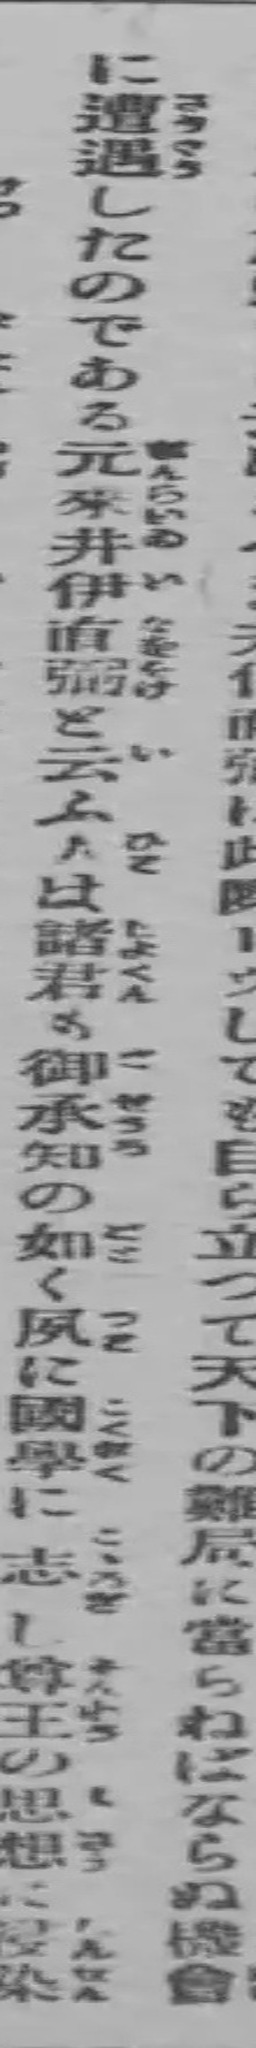井伊掃部頭に遭遇したのである元来井伊直弼と云ふ人は諸君も御承知の如く夙に国学に志し尊王の思想に浸染
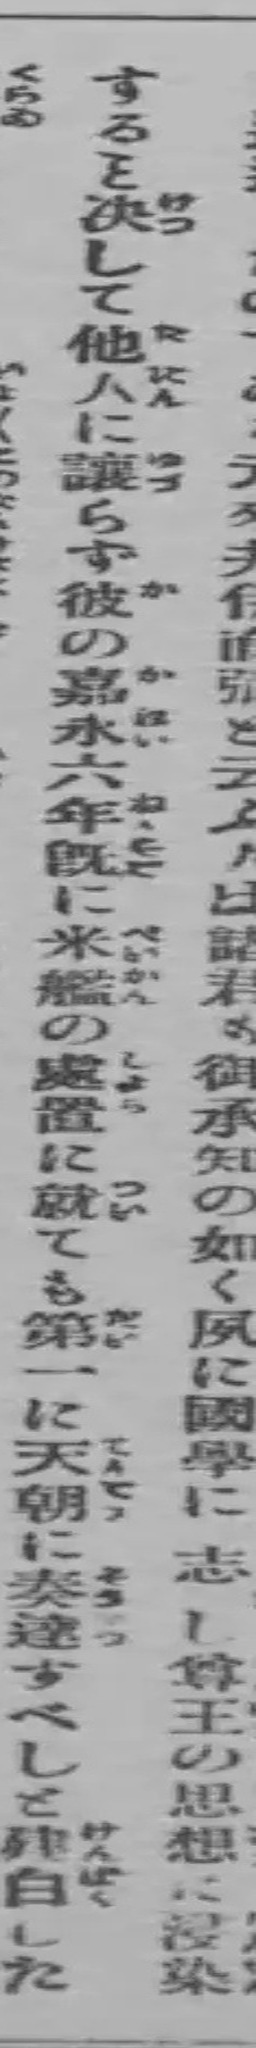すること決して他人に譲らず彼の嘉永六年既に米艦の処置に就ても第一に天朝に奏達すべしと建白した
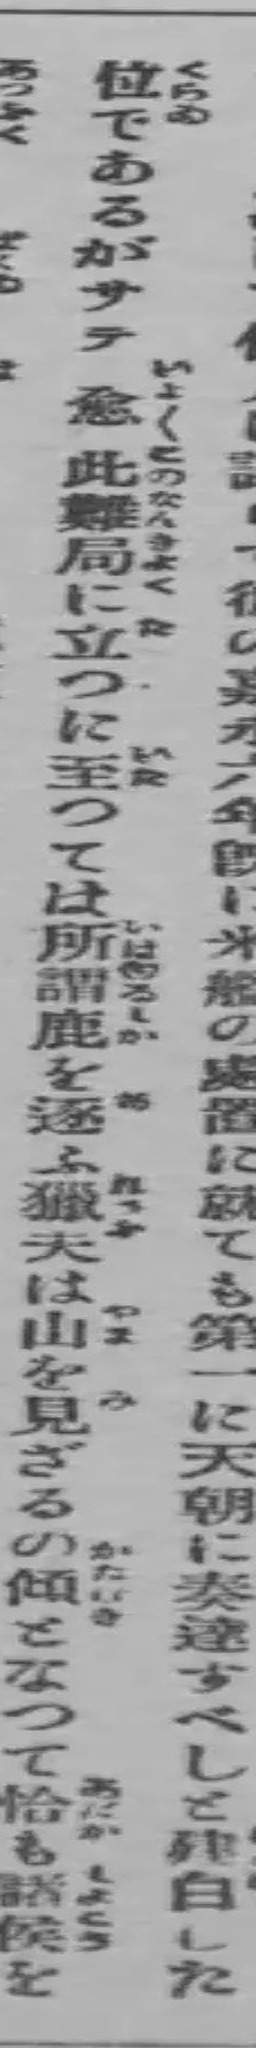位であるがサテ愈此難局に立つに至つては所謂鹿を逐ふ猟夫は山を見ざるの傾となつて恰も諸侯を
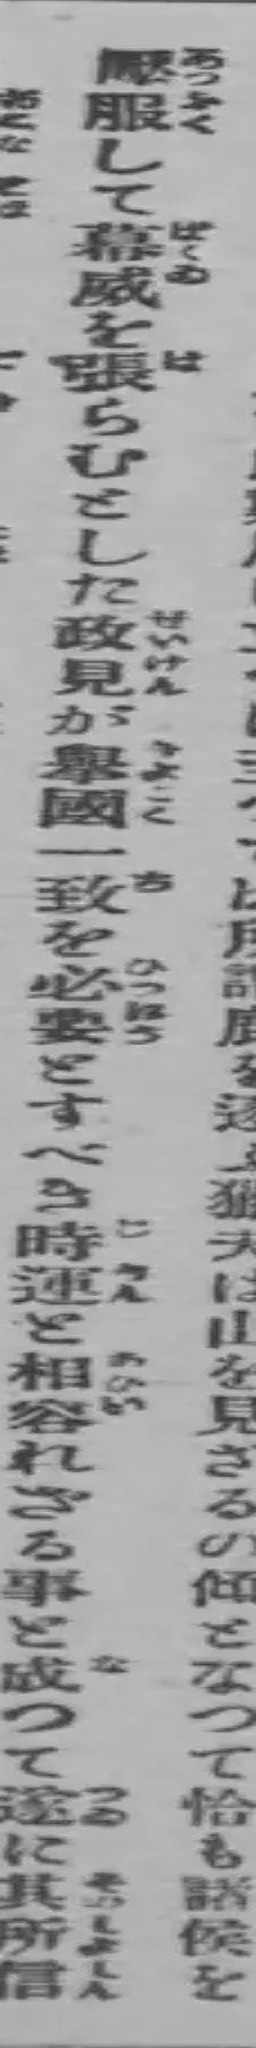圧服して幕威を張らむとした政見が挙国一致を必要とすべき時運と相容れざる事と成つて遂に其所信
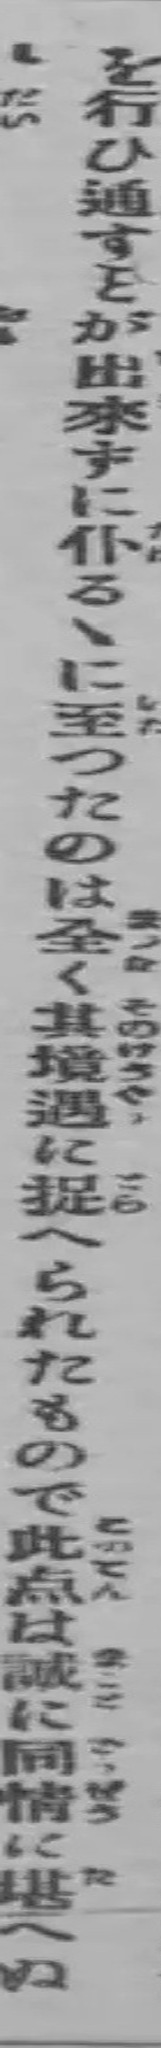を行ひ通すことが出来ずに仆るゝに至つたのは全く其境遇に捉へられたもので此点は誠に同情に堪へぬ
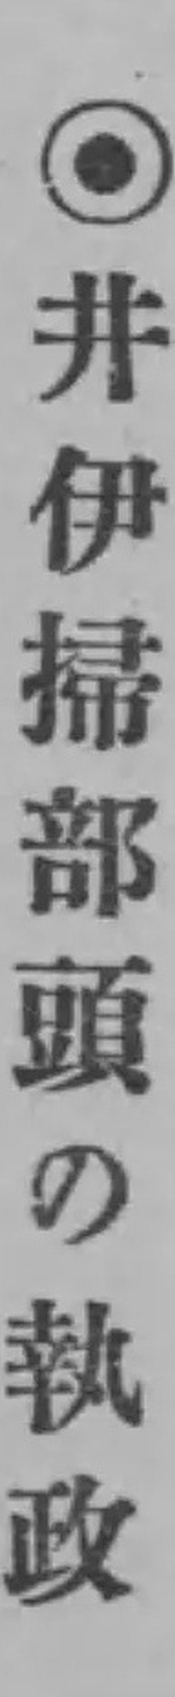◉井伊掃部頭の執政
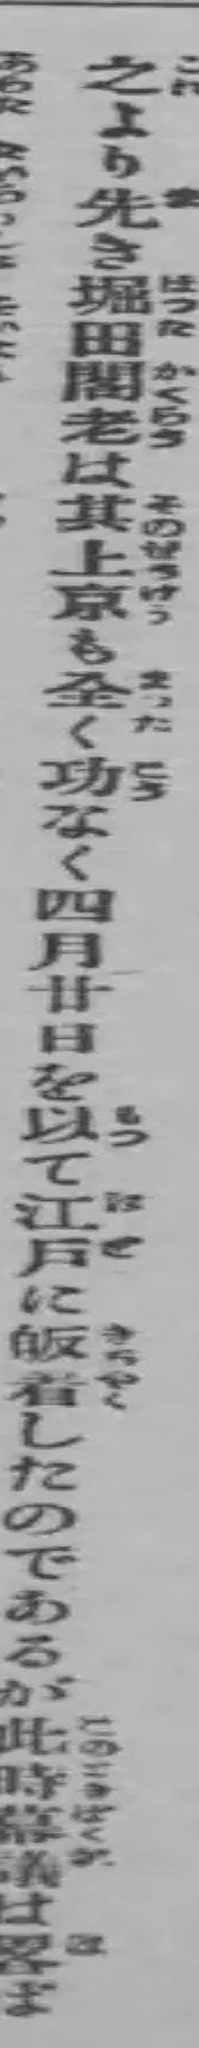之より先き堀田閣老は其上京も全く功なく四月廿日を以て江戸に皈着したのであるが此時幕議は略ぼ
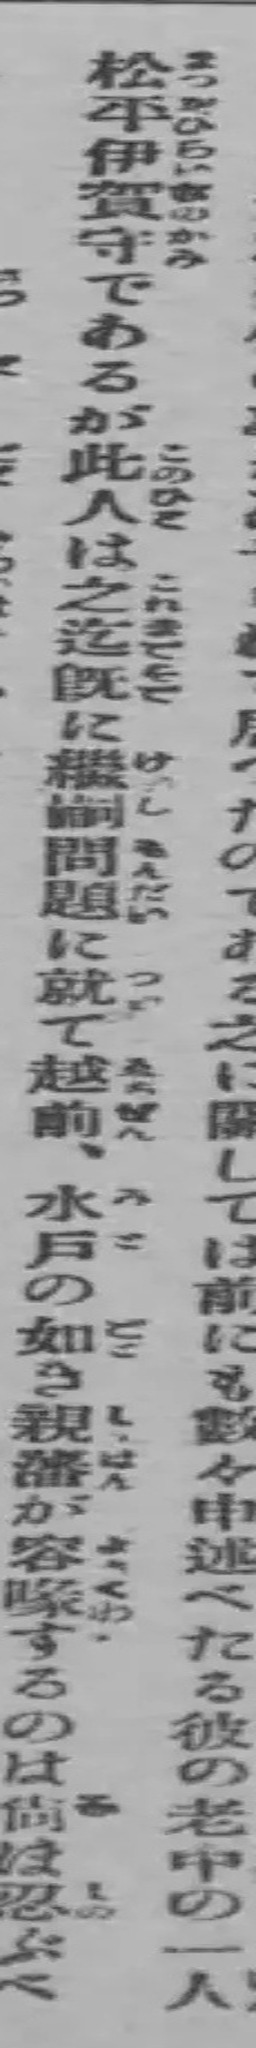松平伊賀守であるが此人は之迄既に継嗣問題に就て越前、水戸の如き親藩が容喙するのは尚ほ忍ぶべ
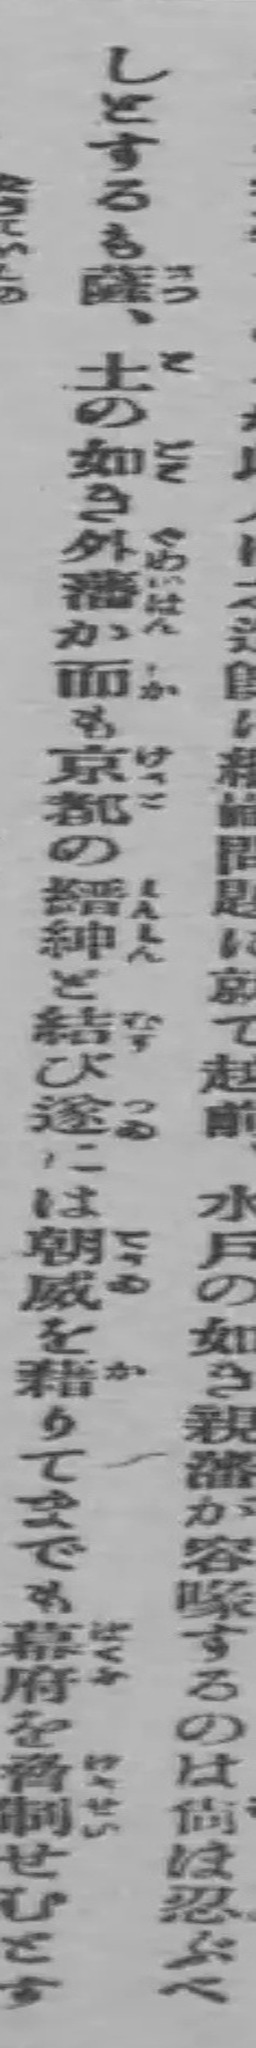しとするも薩、土の如き外藩か而も京都の縉紳と結び遂には朝威を籍りてまでも幕府を脅制せむとす
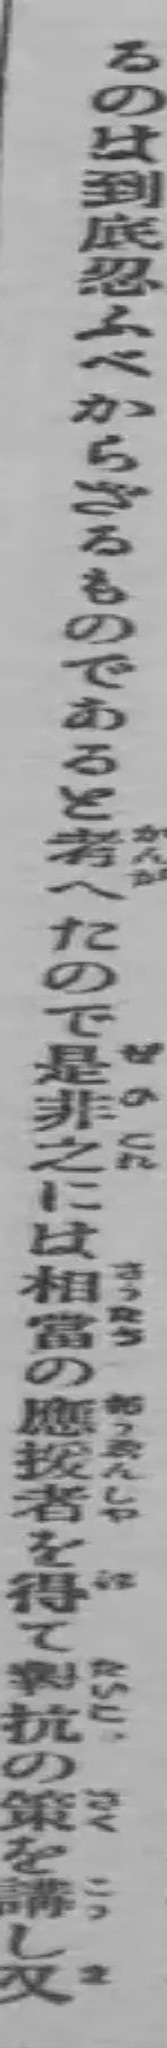るのは到底忍ふべからざるものであると考へたので是非之には相当の応援者を得て対抗の策を講し又
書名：豊橋市史談
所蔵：国立国会図書館 National Diet Library, JAPAN
